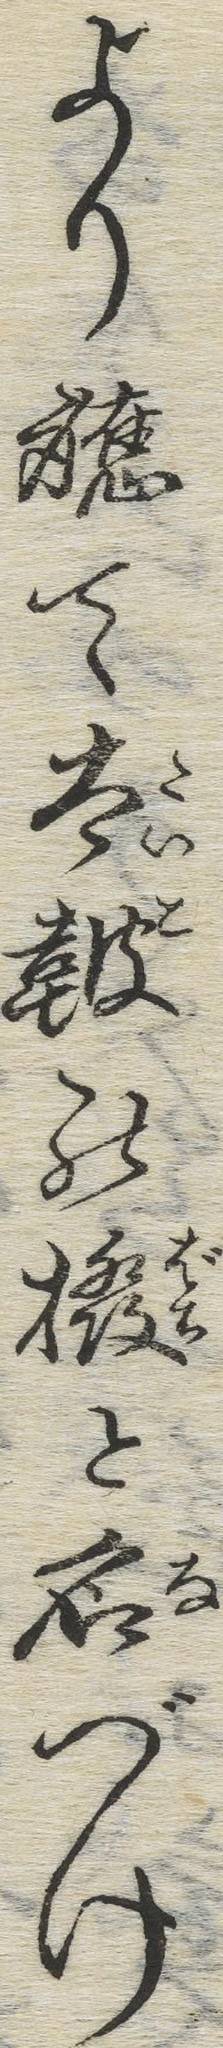より軈て太皷の撥と名づけ
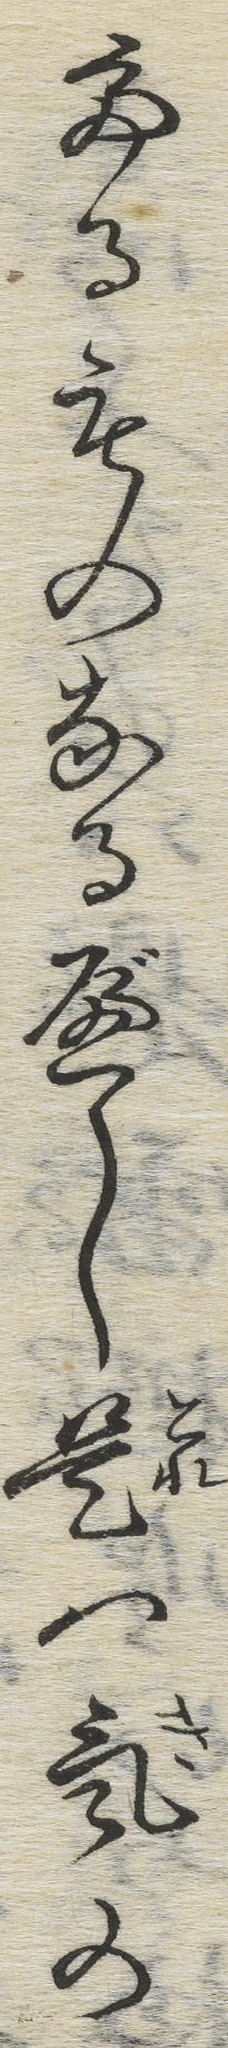たるものなるべし是は気の
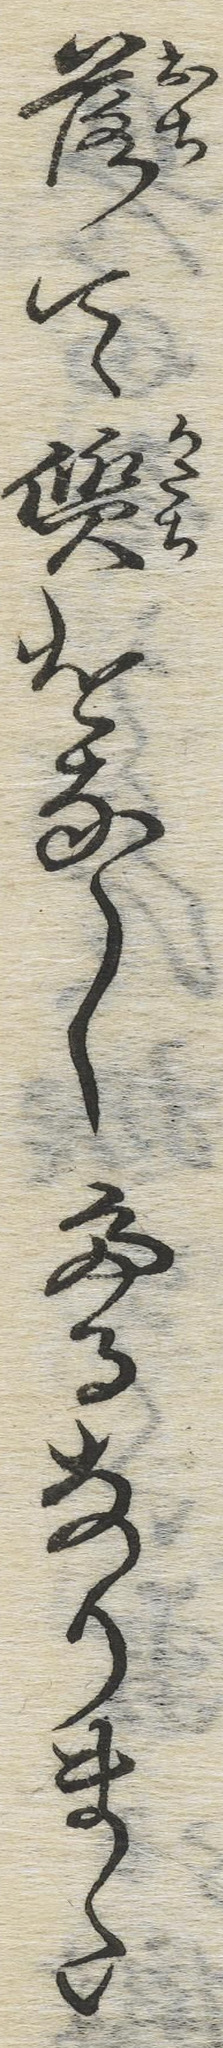落て質？をなしたるなりまた
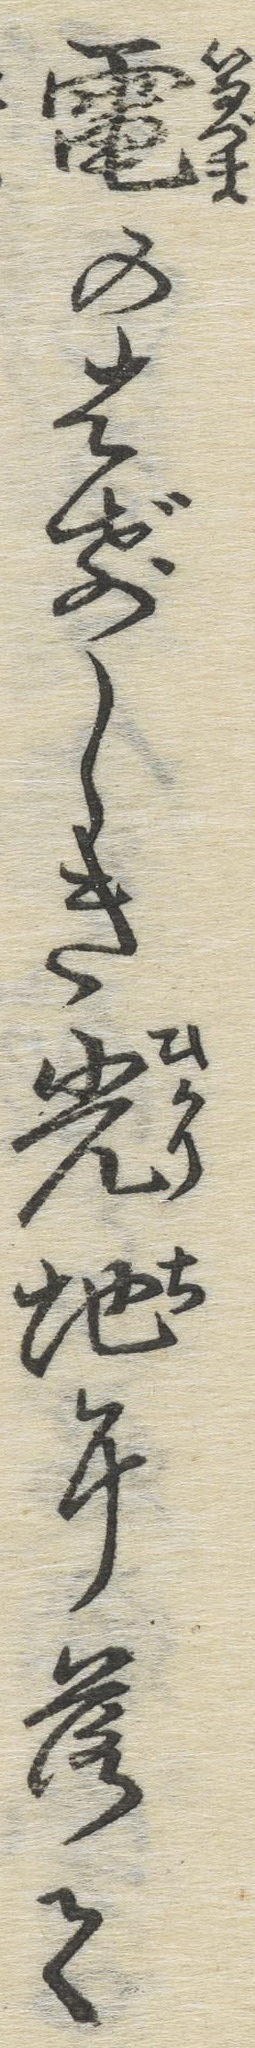電のはげしき光地に落て
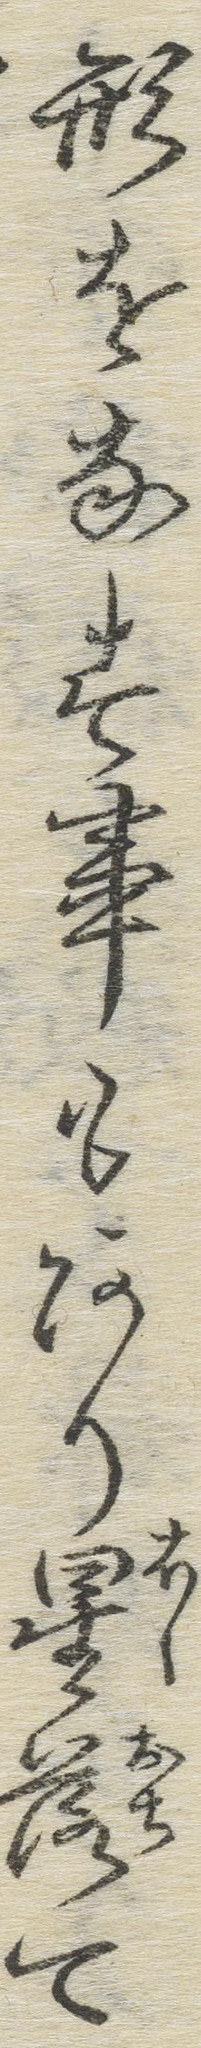形をなす事もあり星落て
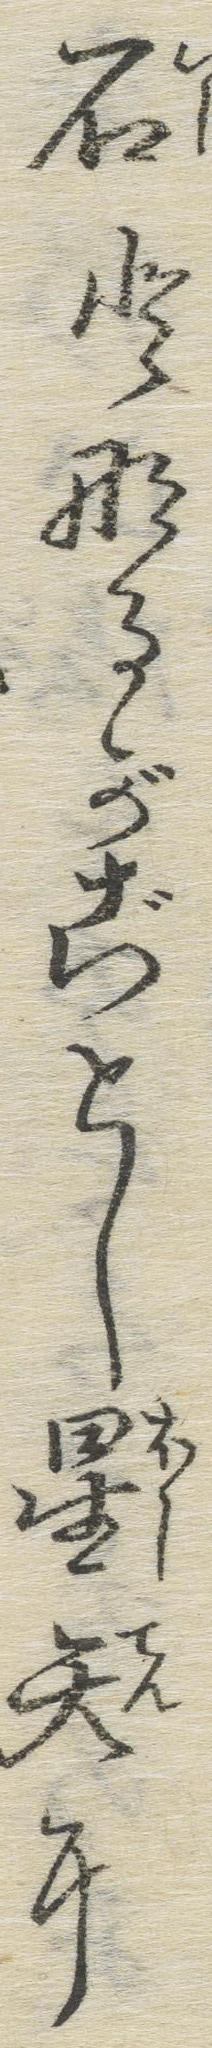石となるがごとし星天に
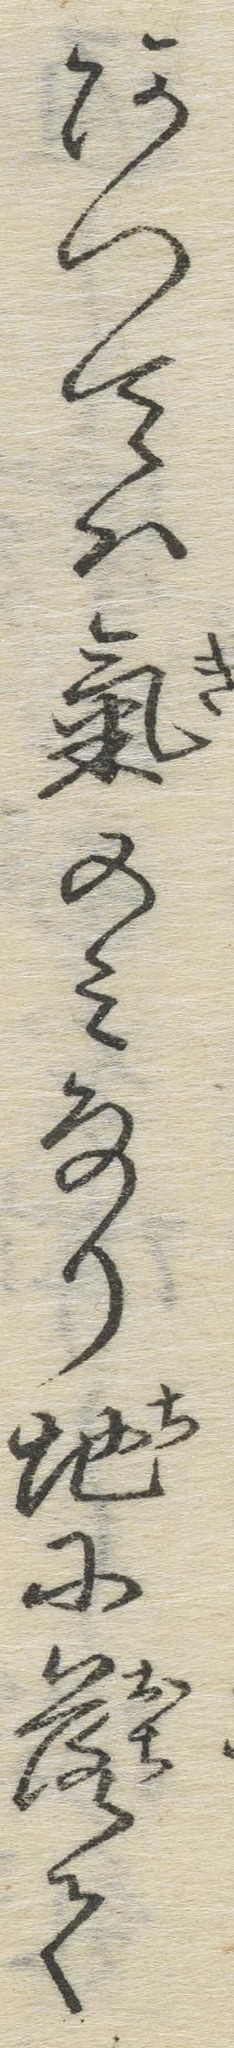あつては気のみなり地に落て
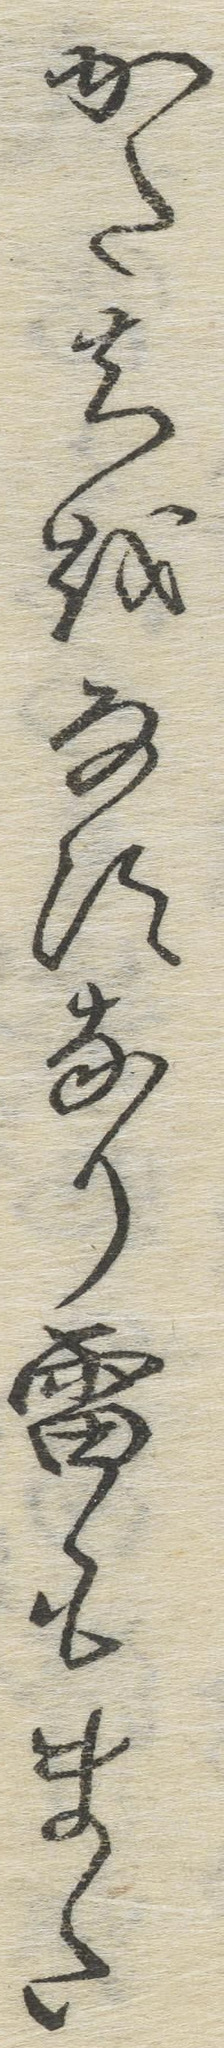かたちをなすなり雷もまた
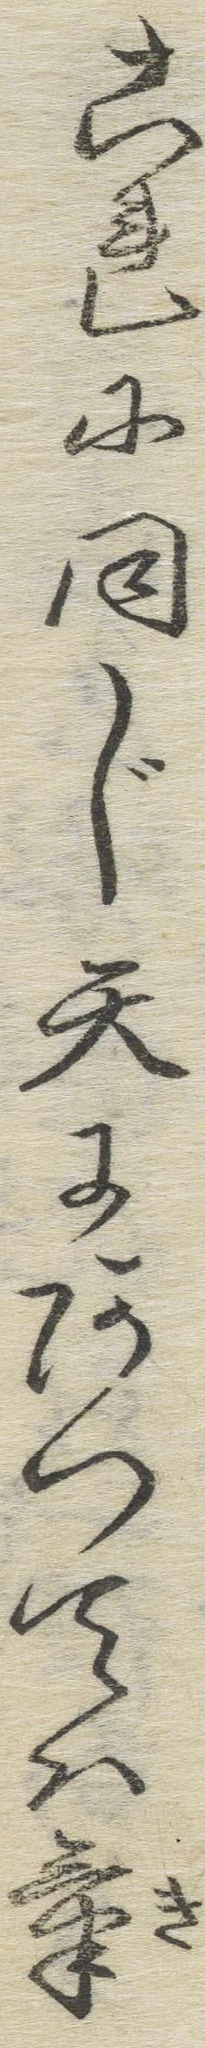これに同じ天にあつては気
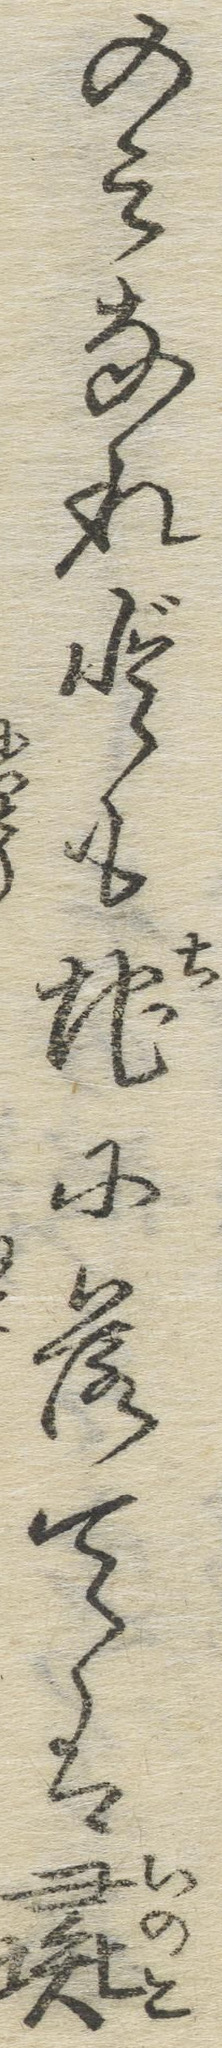のみなれども地に落ては彘
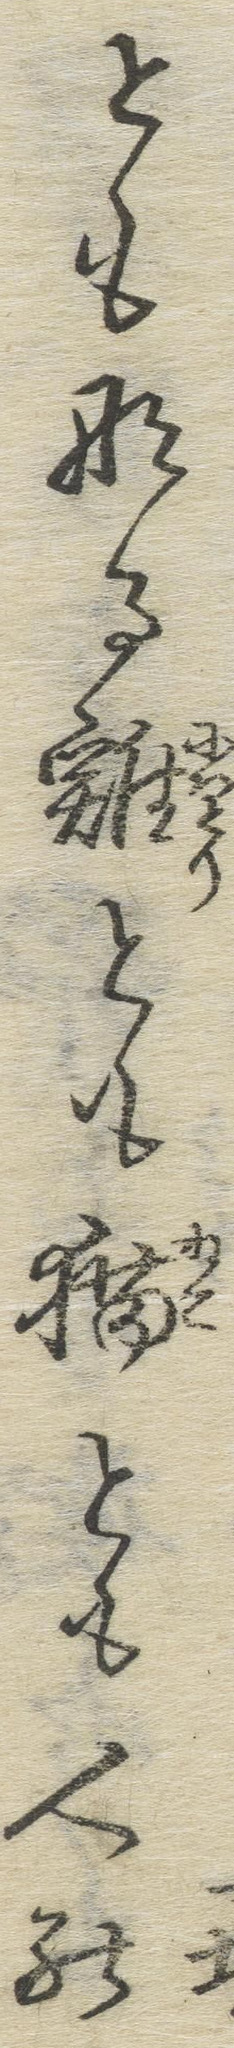ともなる雞とも猫とも人の

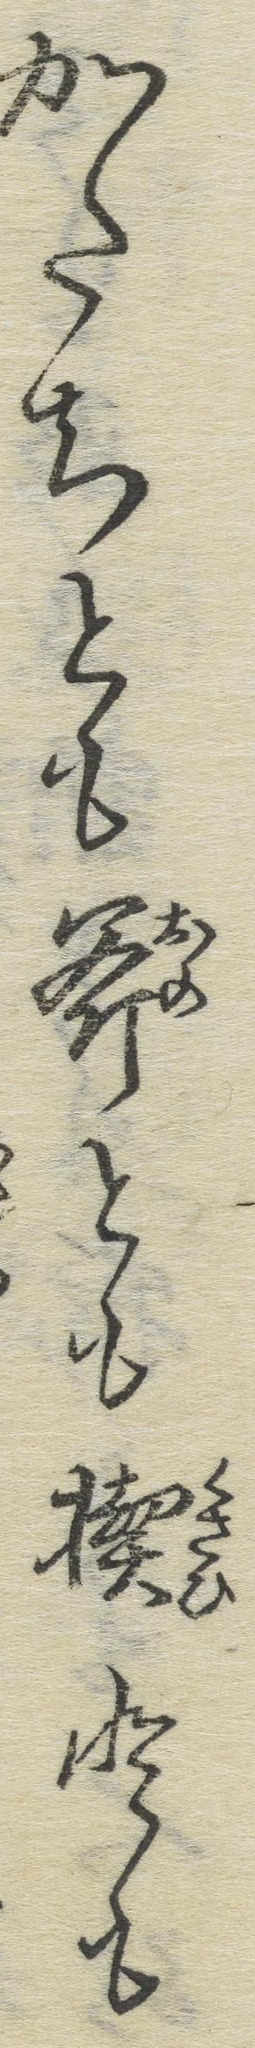かたちとも斧とも楔とも
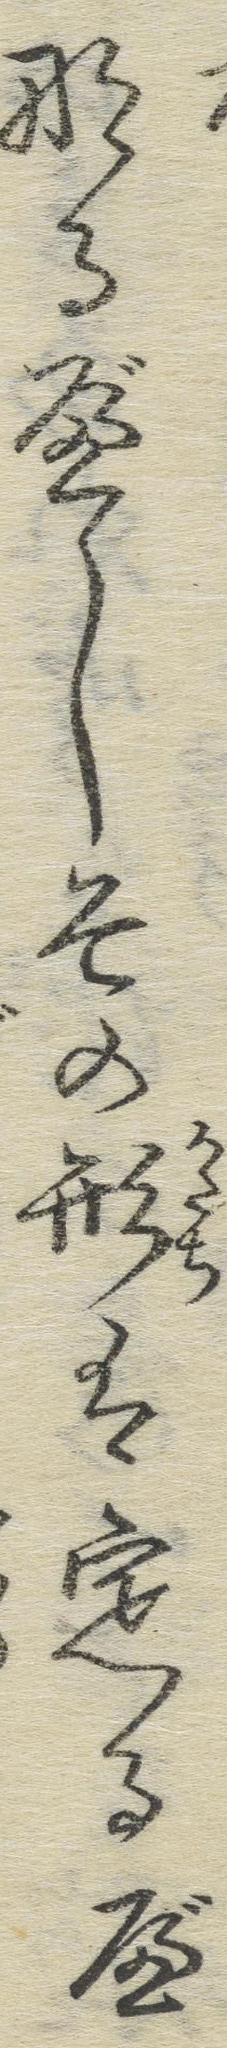なるべしその形は定るべ
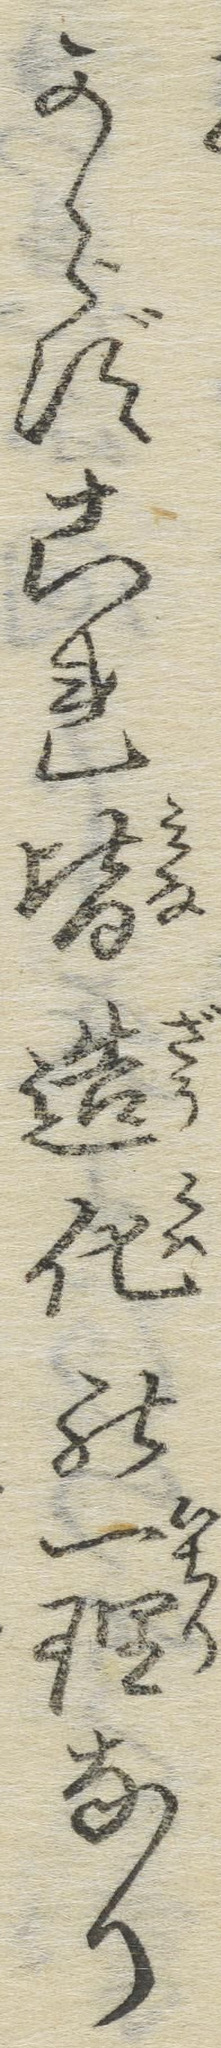からずこれ皆造化の一理なり
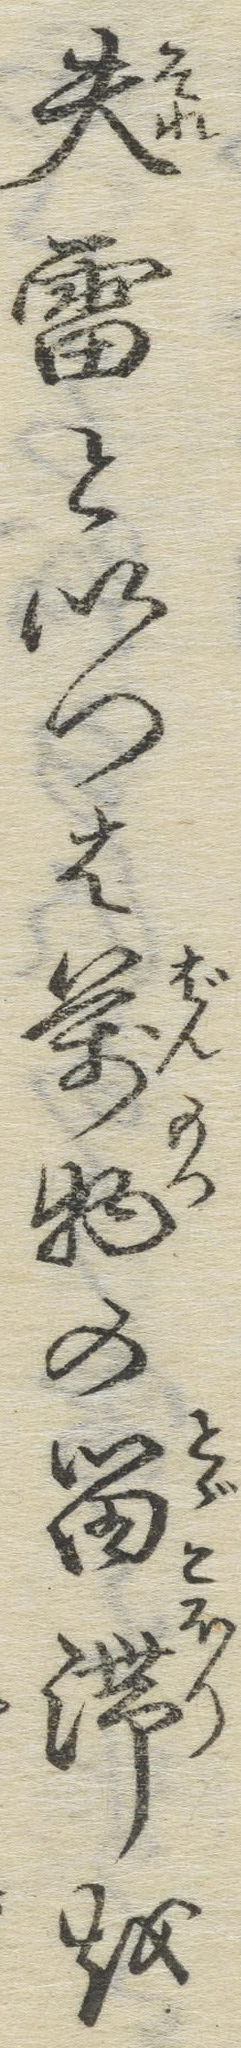夫雷といつは万物の留滞を
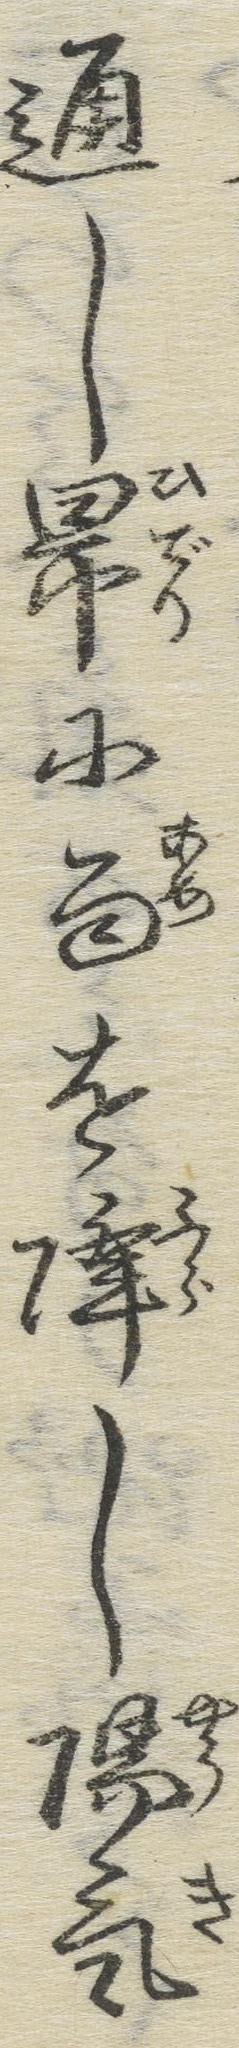通し旱に雨を降し陽気
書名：雷公地震由來記　全
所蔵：東京大学地震研究所図書室 Earthquake Research Institute Library, The University of Tokyo, JAPAN
